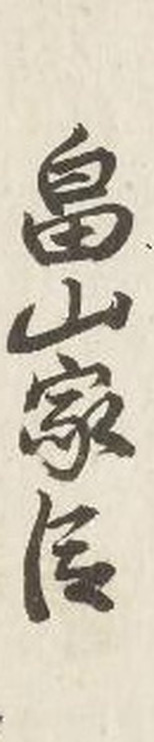畠山家臣
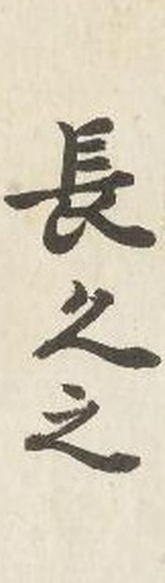長久之
